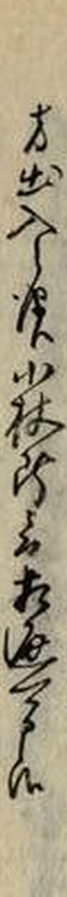方出入之儀小杖断に而相通可申候
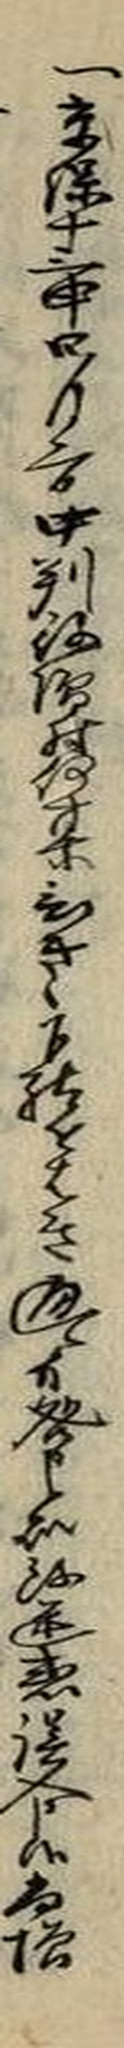一享保十三申四月二日中判役増村何某ひき候下駄をはき通候ニ付咎申候処致迷惑誤入申候尚増
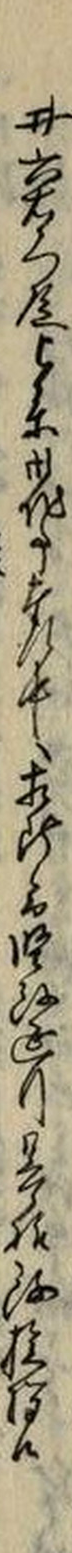井六左衛門殿被参御作事奉行中へ相断候而堅致延行呉候様致挨拶候
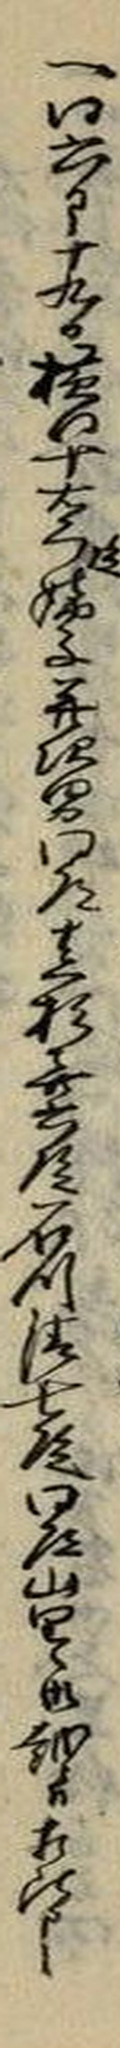一同六月十九日横田十右衛門殿嫡子并次男同道真杉喜六殿石川清七殿同道山里へ御越に付相断申
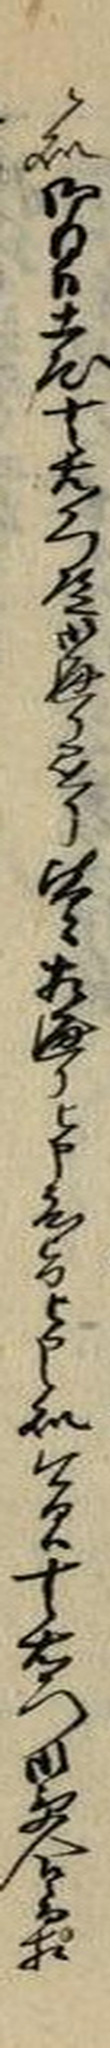候処御目付土屋十郎右衛門殿御通り懸り皆々相通り被申度旨被申候処今日は十郎右衛門御受合に而相
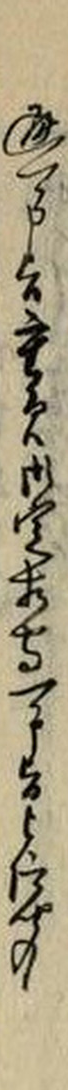通可申旨重而は御定相守可申旨被仰聞候
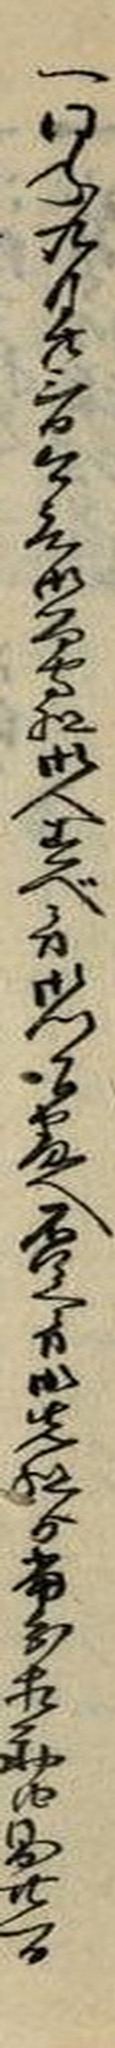一同年九月廿三日今度御留守組御人すべに付御門所番人不足に付御先組ゟ当分相勤候由則廿一日
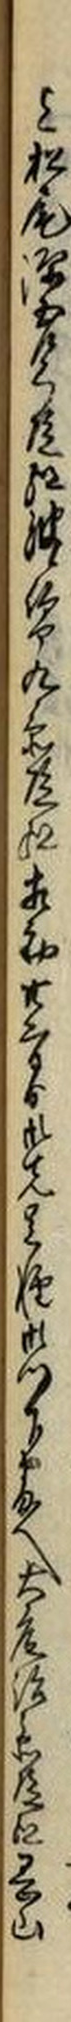迄松尾源五左衛門殿組波々伯部九兵衛殿組相勤廿三日ゟ御先足軽御門下番人大藤治兵衛殿組岡山
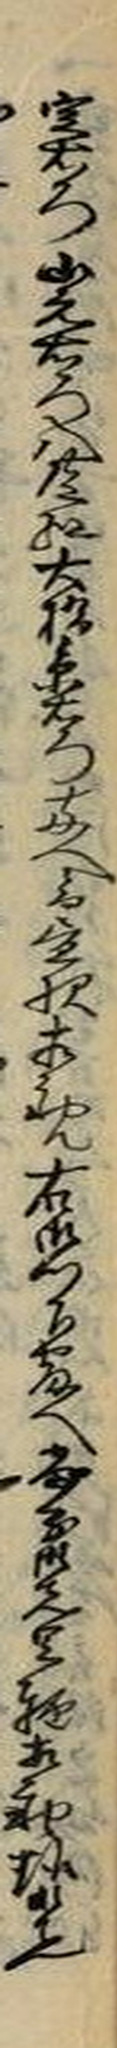定右衛門山元右衛門八殿組大橋泉左衛門両人に而昼夜相勤候右御門下番人当分御先足軽相勤候趣御先
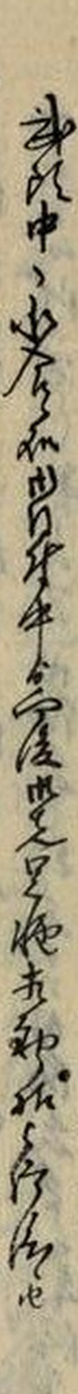武頭中へ承合候処御目付中ゟ向後御先足軽相勤候様被仰渡候由
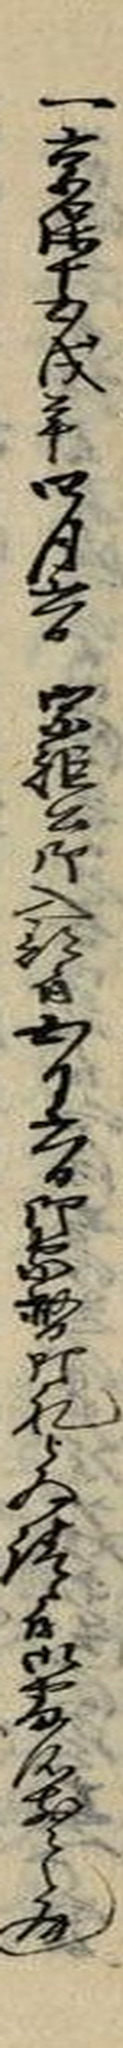一享保十五戌年四月六日宗矩公御入部候ニ付五月六日御家督御礼被為請候付御番所前々之通
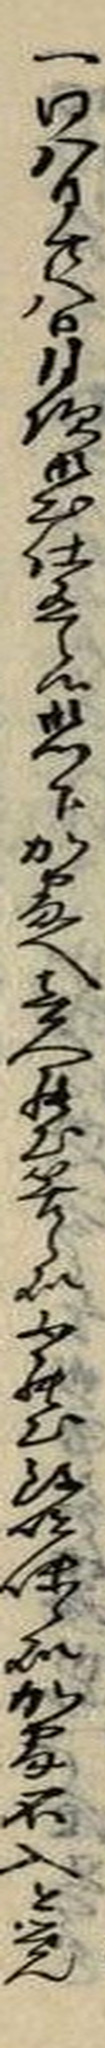一同八月廿八日月次御出仕有之候御門下加番人壱人罷出候筈之処不罷出致吟味候処加番不入と覚
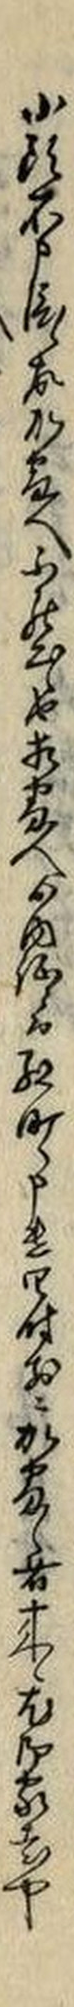小頭不申渡候故加番人不罷出候由相番人ゟ内証に而組町へ申遣四時前に加番之者来候尤御家老中
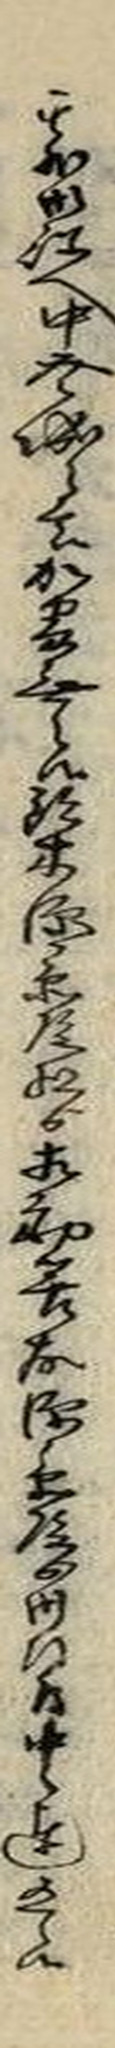其外御役人中登城之節加番無之候鈴木源兵衛殿組ゟ相勤候筈故源兵衛殿ゟ御目付中へ達有之候
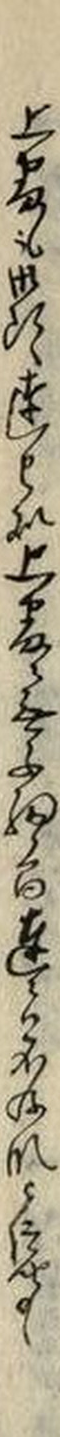上番も御断候達申候処上番に無子細候間達には不及候段被仰聞候
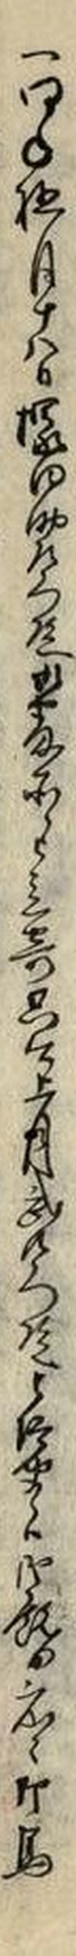一同年極月十八日塚田助左衛門殿御番所へ被立寄只今上月武左衛門殿被仰聞候は御厩ゟ度々御馬
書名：御門御櫓之部
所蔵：福井県文書館 Fukui Prefectural Archives
